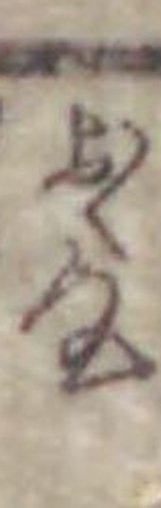おく様
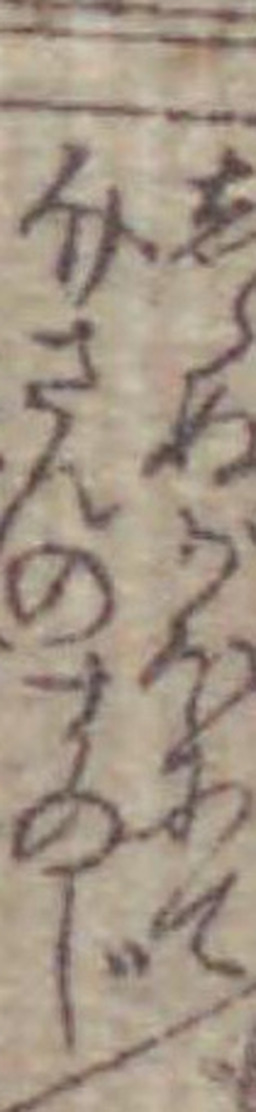介さんのすのじ
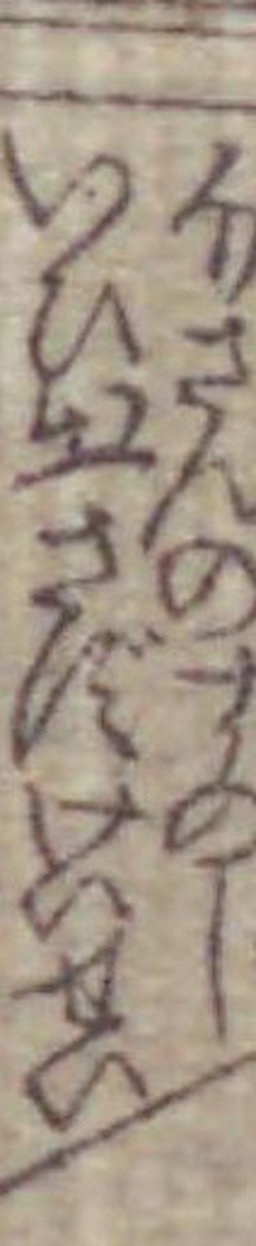いひ出さずけいせい
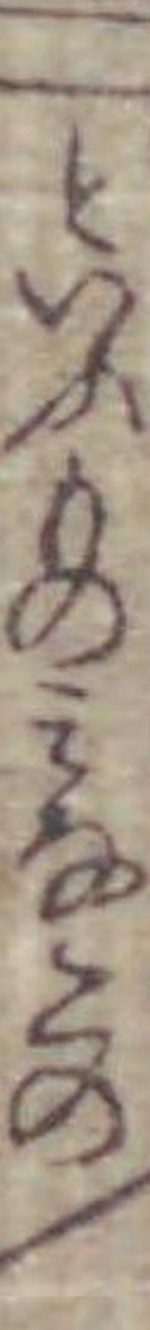といふものみなこの
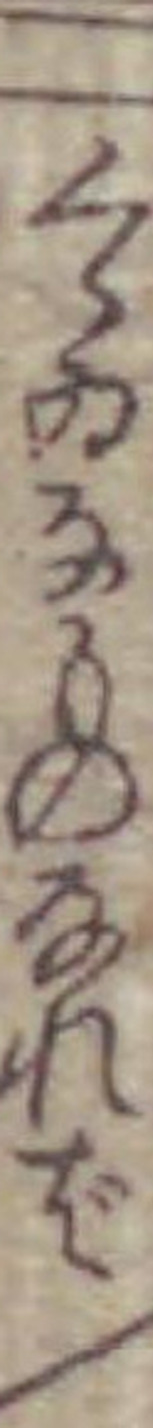くらゐなものなれば
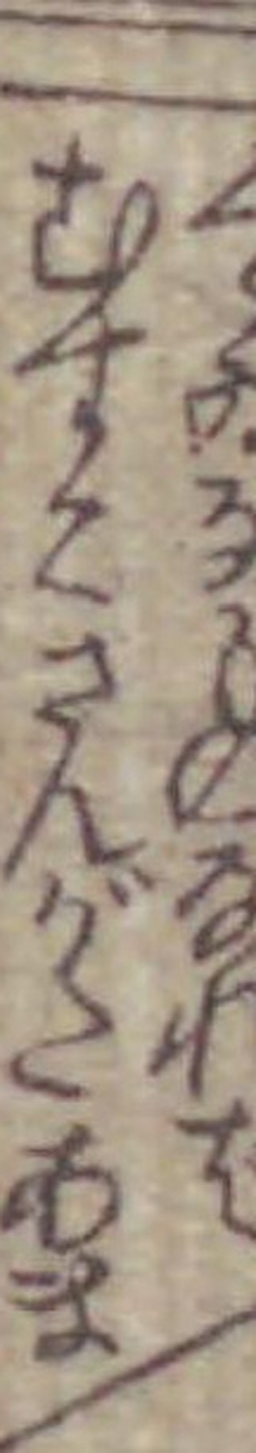むすこさんがたあま
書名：嗚呼不侭世之助噺 : 3巻
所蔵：国立国会図書館 National Diet Library, JAPAN
